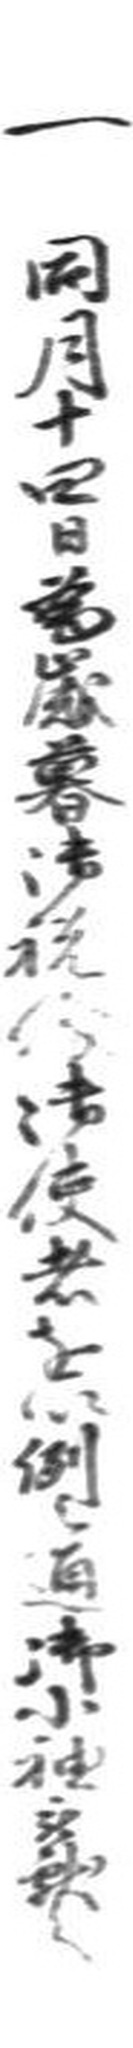一同月十四日為歳暮御祝儀御使者を以例之通御小袖被献之
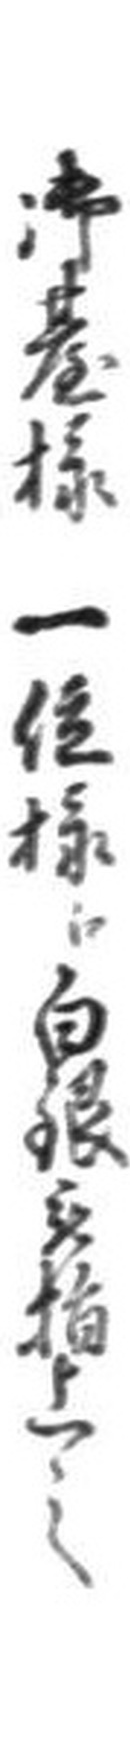御台様一位様江白銀被指上之

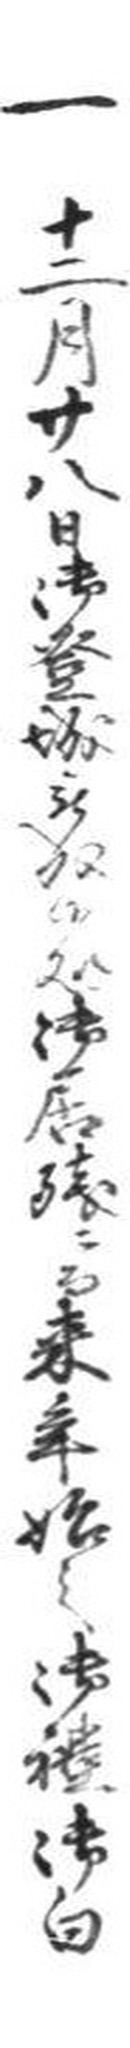一十二月廿八日御登城被成候処御居残ニ而来年始之御礼御白
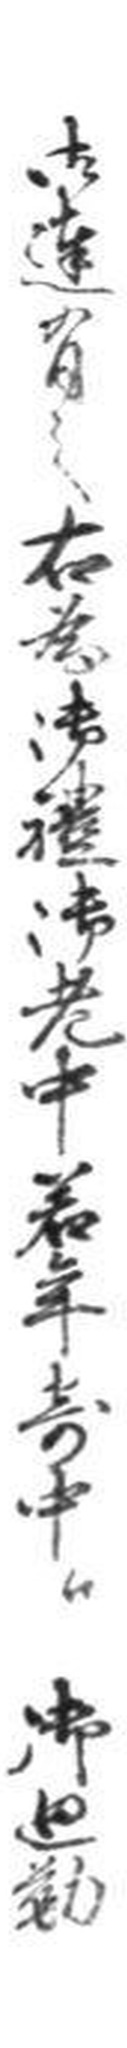御達有之右為御礼御老中若年寄中江御廻勤
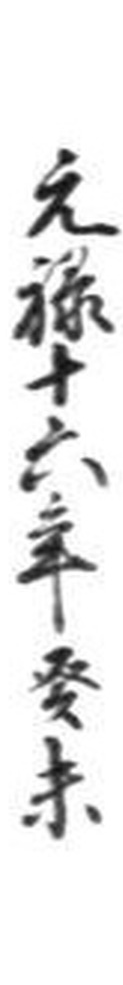元禄十六年癸未
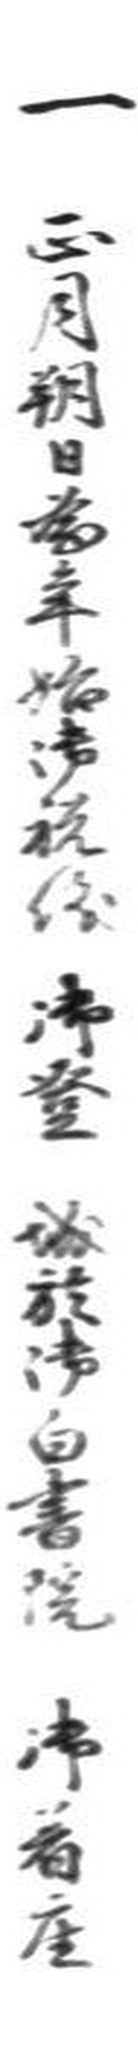一正月朔日為年始御祝儀御登城於御白書院御着座
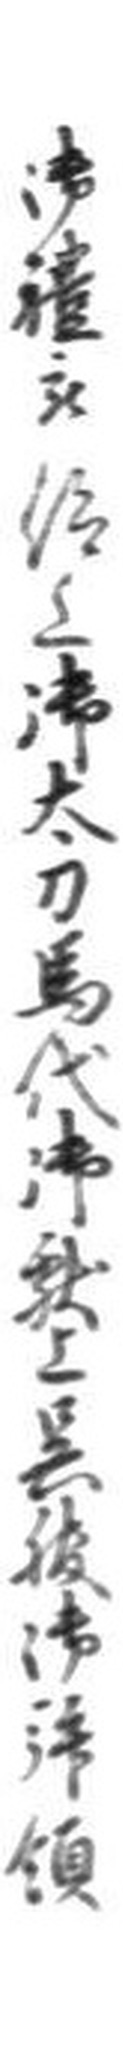御礼被仰上御太刀馬代御献上呉服御拝領
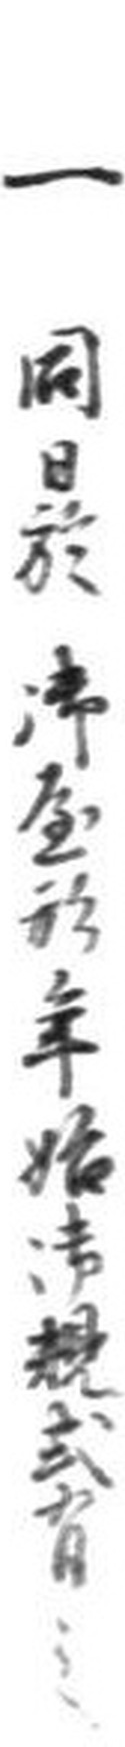一同日於御屋形年始御規式有之
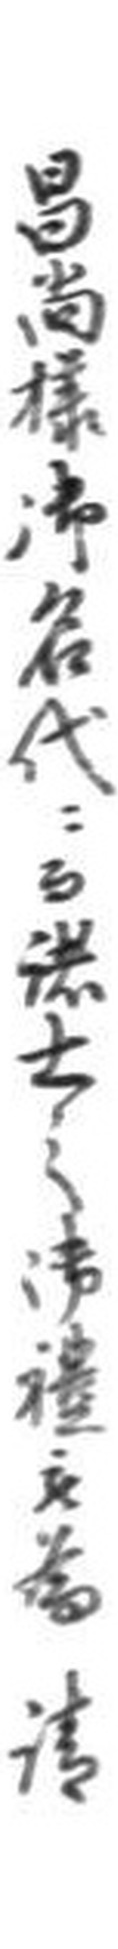昌尚様御名代ニ而諸士之御礼被為請
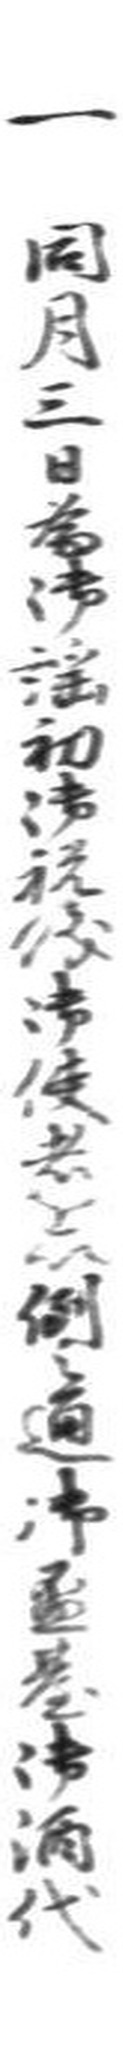一同月三日為御謡初御祝儀御使者を以例之通御盃台御酒代
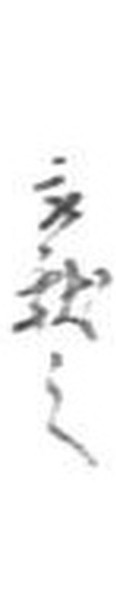被献之

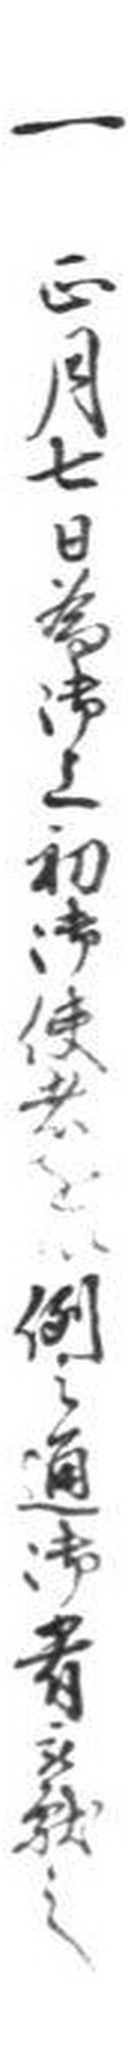一正月七日為御上初御使者を以例之通御肴被献之
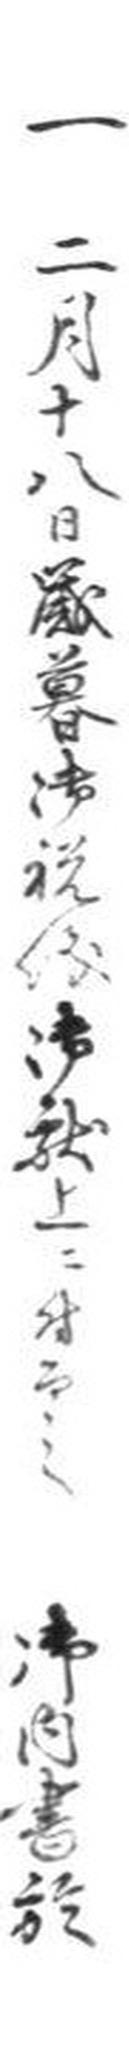一二月十八日歳暮御祝儀御献上ニ付而之御内書於
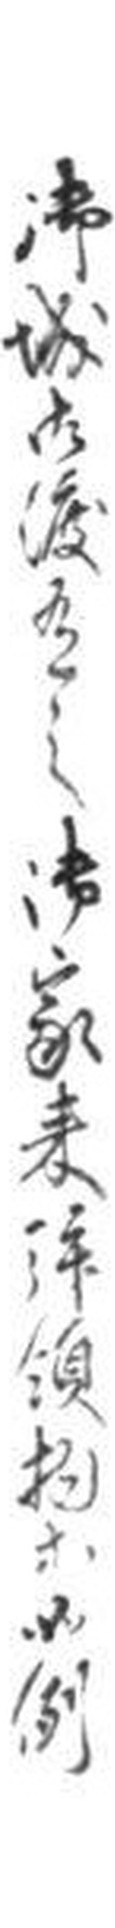御城御渡有之御家来拝領物等如例
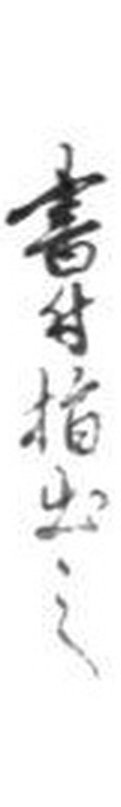書付指出之
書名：家譜 二十二 吉品公 従元禄十五年到同十六年
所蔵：福井県文書館 Fukui Prefectural Archives
